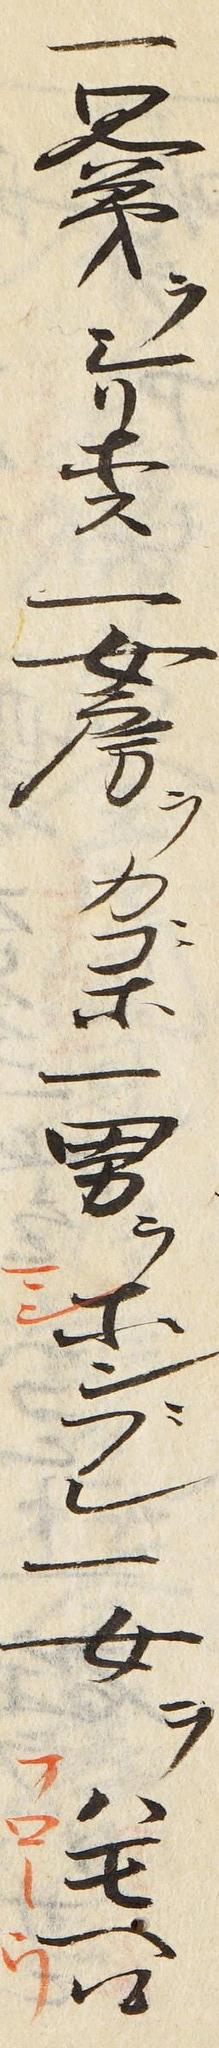一兄弟ヲシリホス一女房ヲカゴホ一男ヲホンブレ一女ヲハモへロ
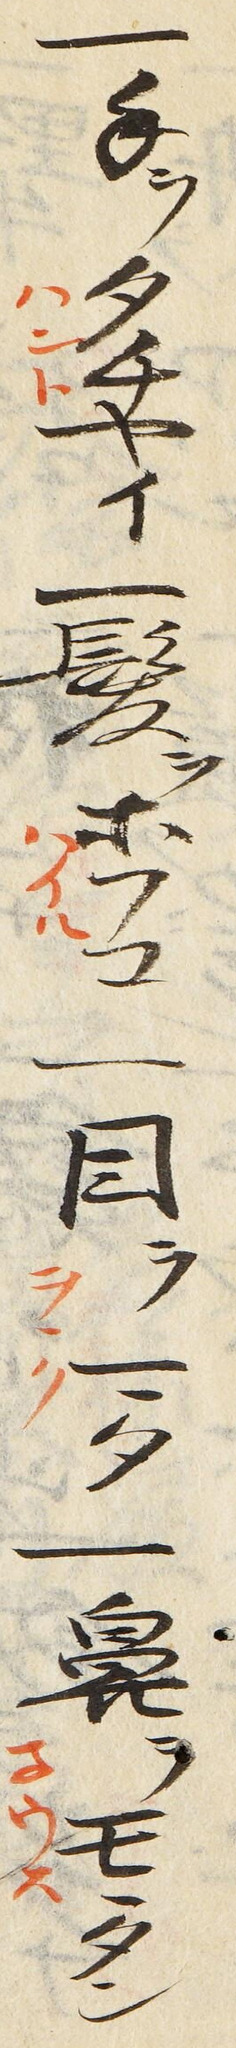一手ヲタチヤイ一髪ヲホフコ一目ヲマタ一鼻ヲモヽタン
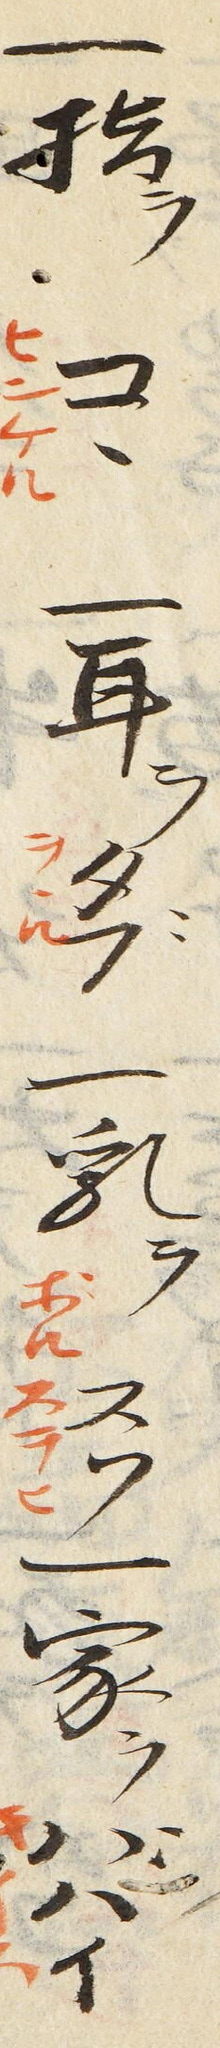一指ヲコヽ一耳ヲタブ一乳ヲスワ一家ヲバハイ
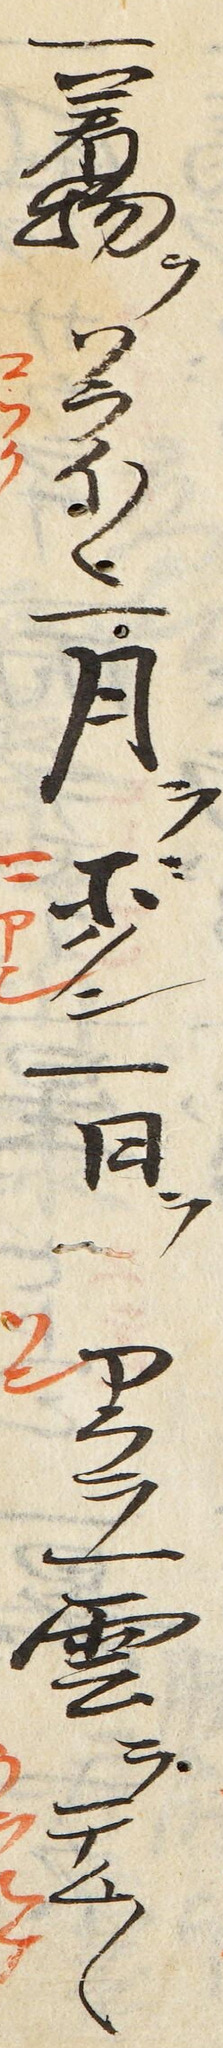一着物ヲワラフト一月ヲボクン一日ヲアウラ一雲ヲテチ〳〵

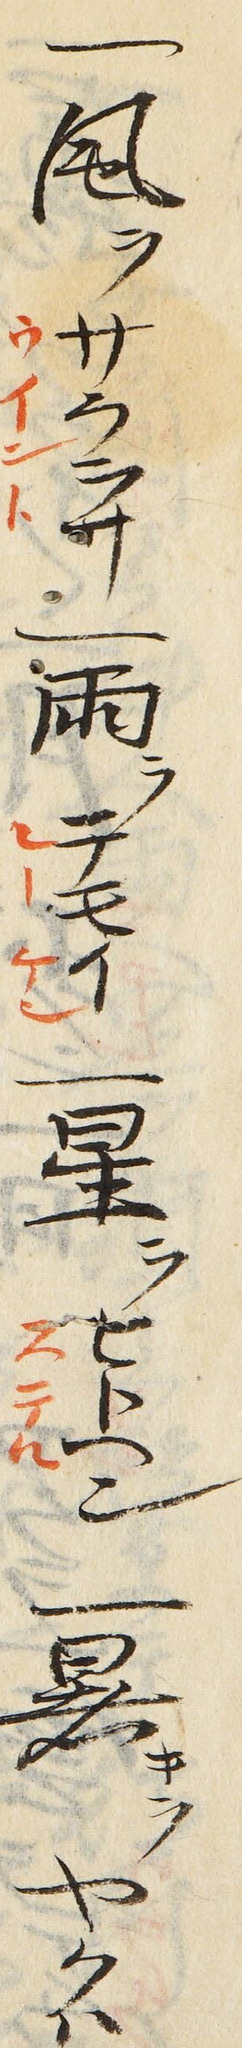一風ヲサララサ一雨ヲテモイ一星ヲヒトへン一暑キヲヤクハ
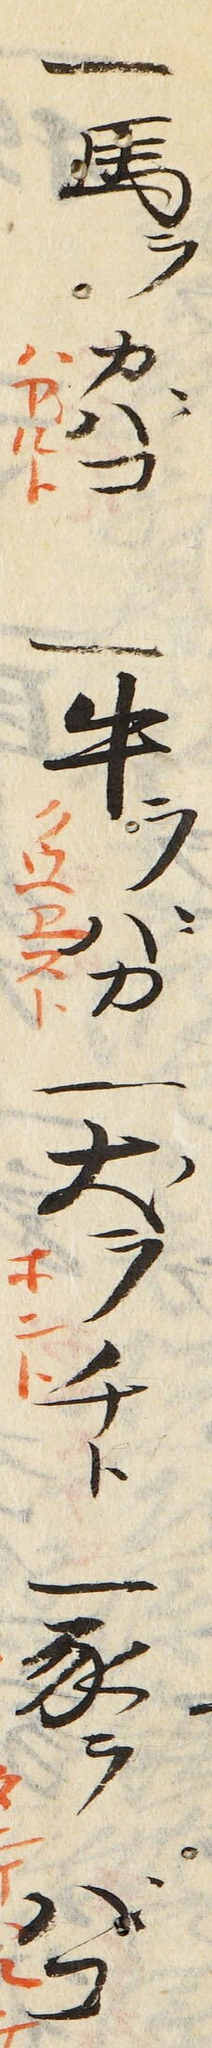一馬ヲカバコ一牛ヲバカ一犬ヲチト一豕ヲバコ
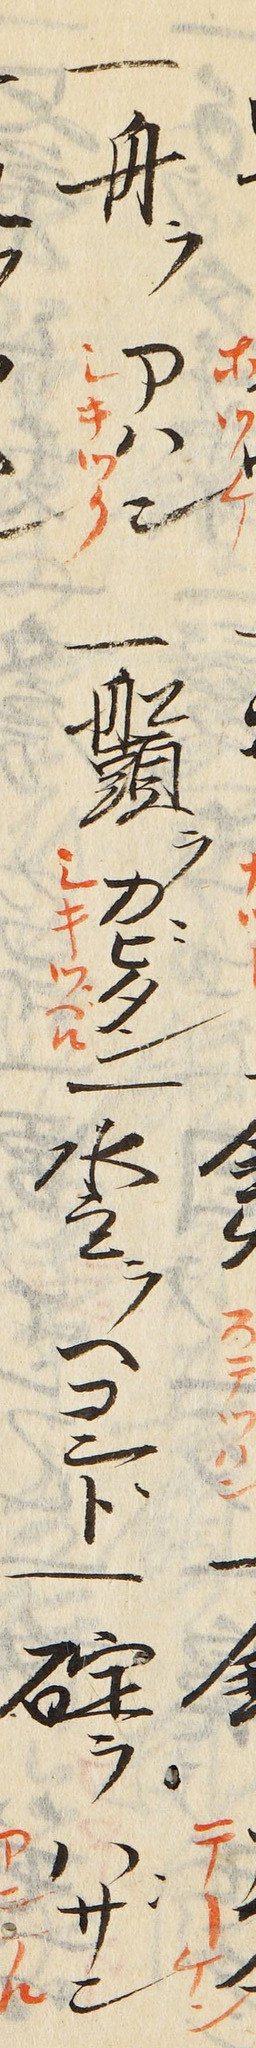一舟ヲアハン一船頭ヲカビタン一水主ヲへコンド一碇ヲハサン
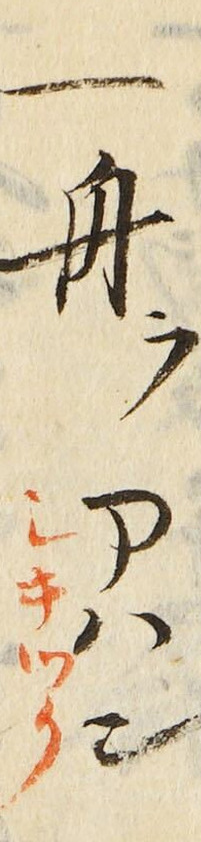一帆ヲアヘン
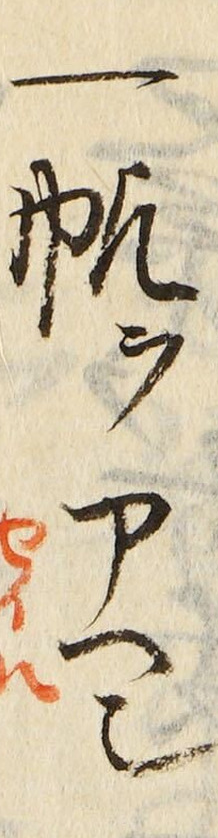一帆ヲアヘン
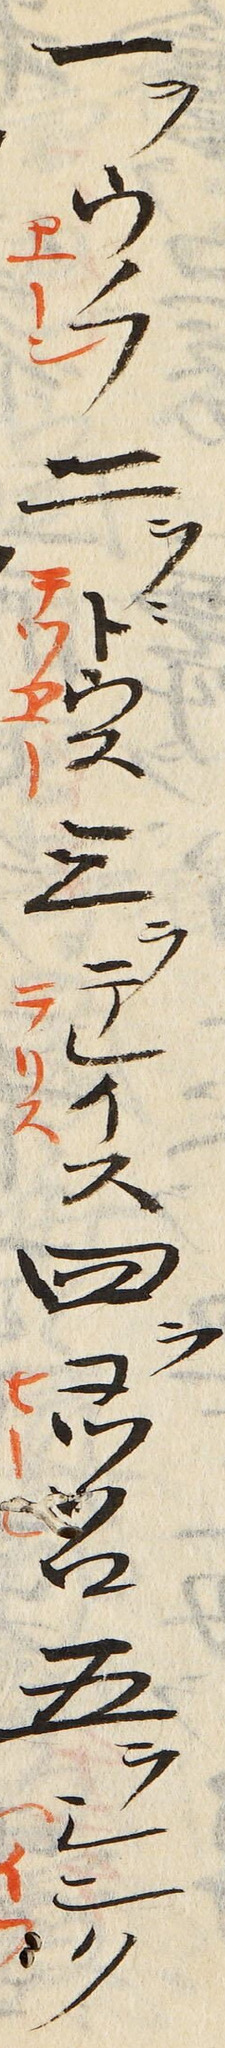一ヲウノフ二ヲドウス三ヲテレイス四ヲコツソロ五ヲシニク
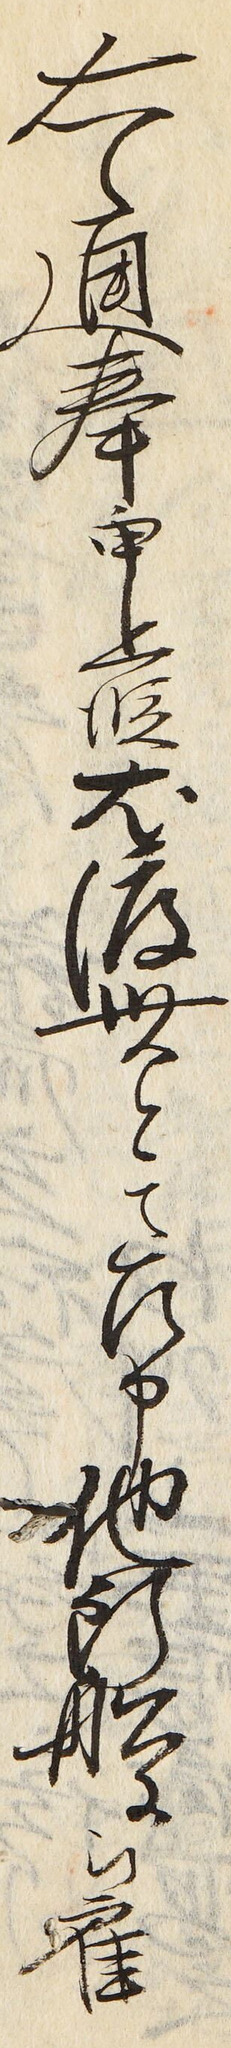右之通奉申上尤渡世とて罷申他所船ニ被雇
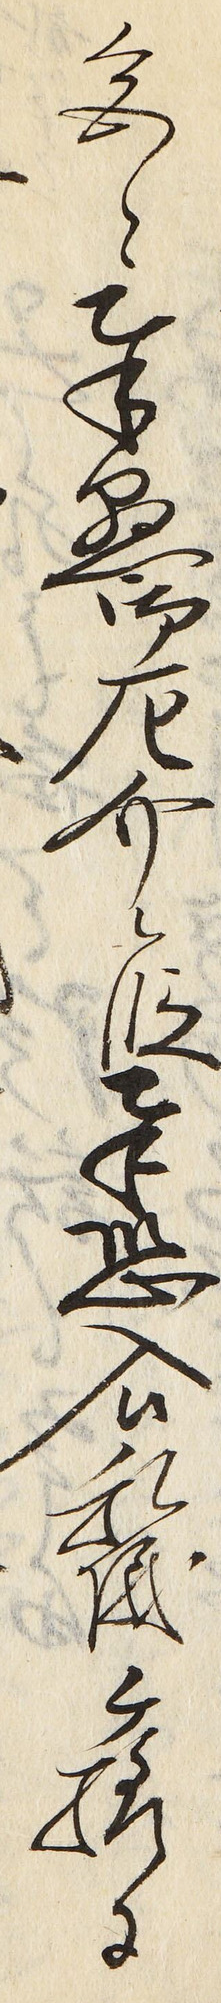色々奉懸御厄介候段奉恐入候私儀ケ様に
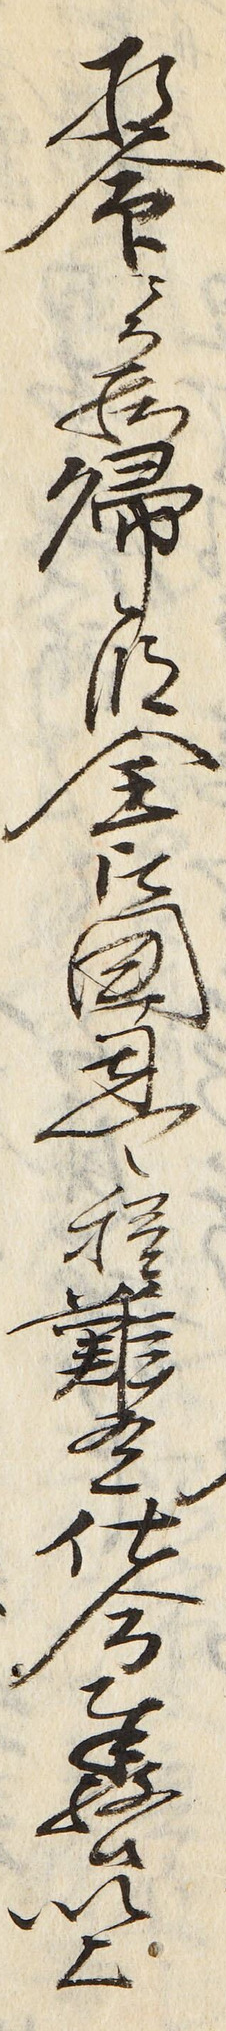打命ニ而相帰候段全御忍ノ程難有仕合奉様候以上
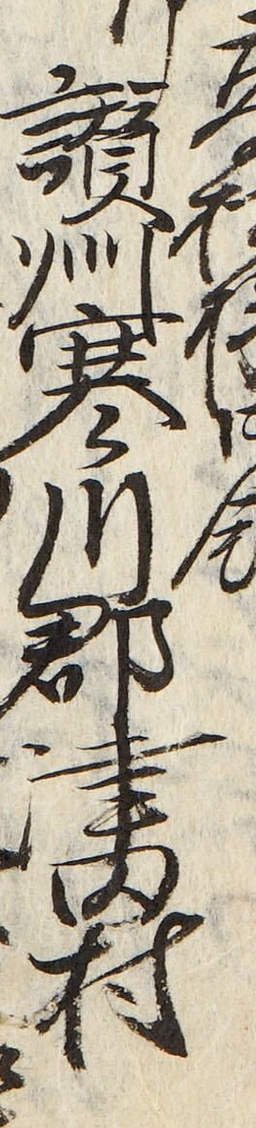讃州寒川郡聿内村
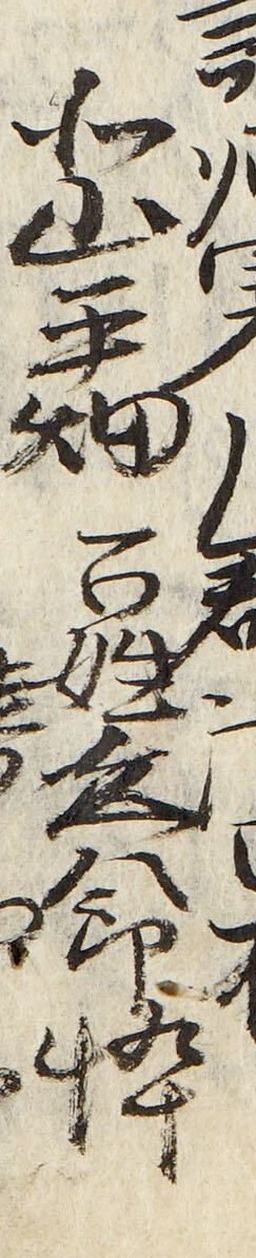北山平畑百姓玄八郎忰
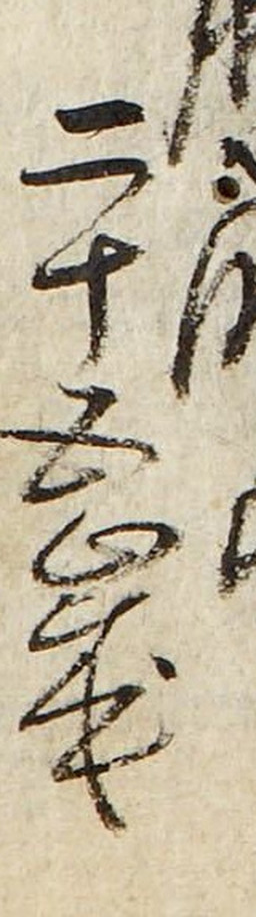二十五歳
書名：漂流記
